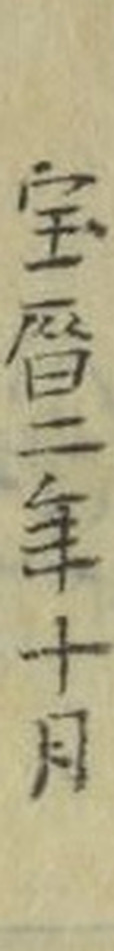宝暦二年十月
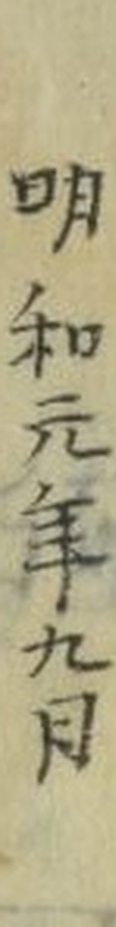明和元年九月
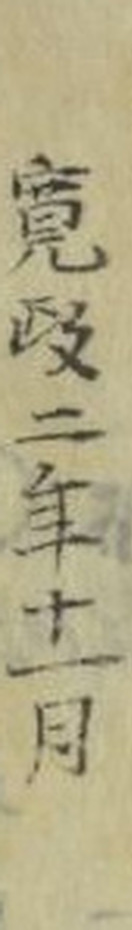寛政二年十一月
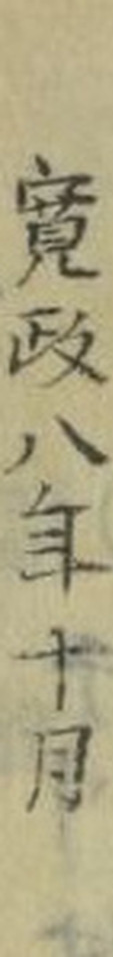寛政八年十月
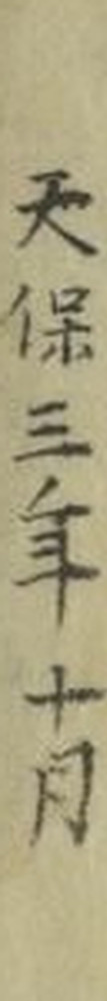天保三年十月

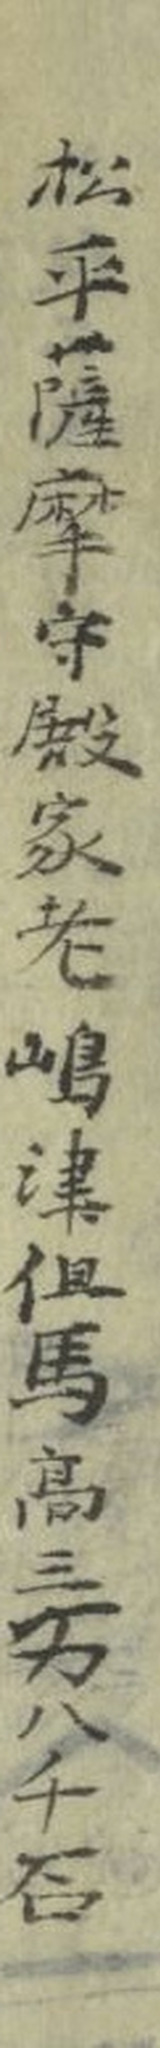松平薩摩守殿家老嶋津但馬高三万八千石
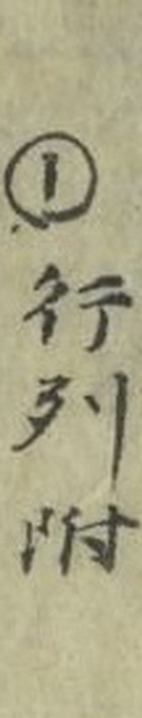行列附
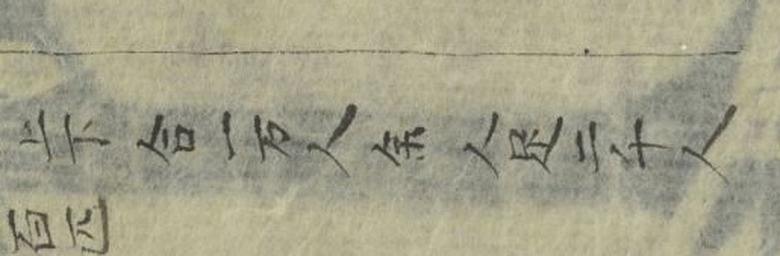人数上下合一万人余人足二千人
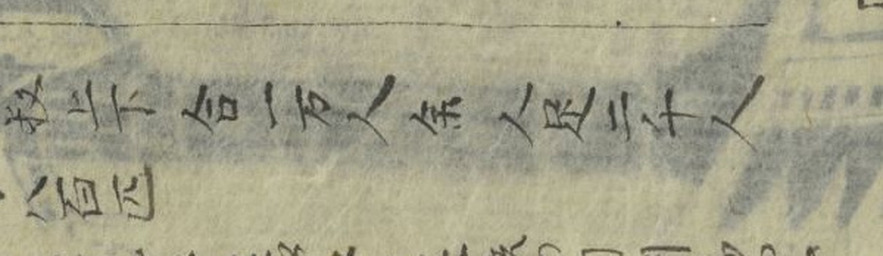人数上下合一万人余人足二千人
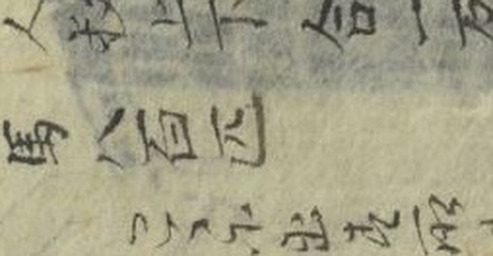馬八百匹
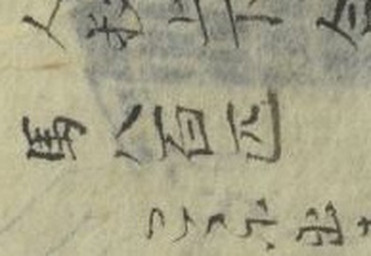馬八百匹
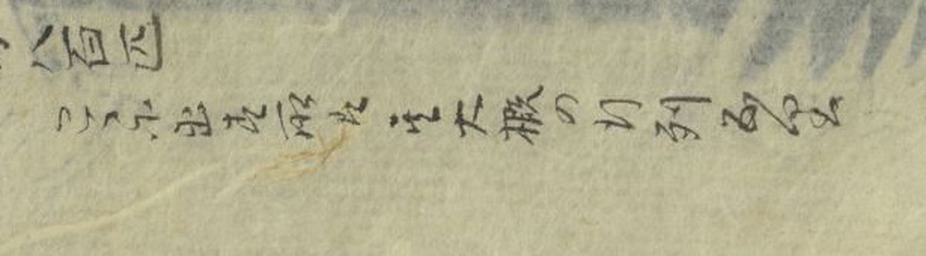こゝに出す所は其大概の行列なり
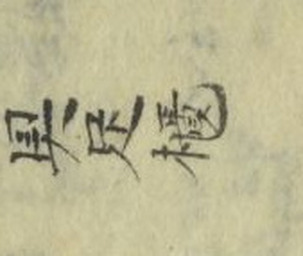具足櫃

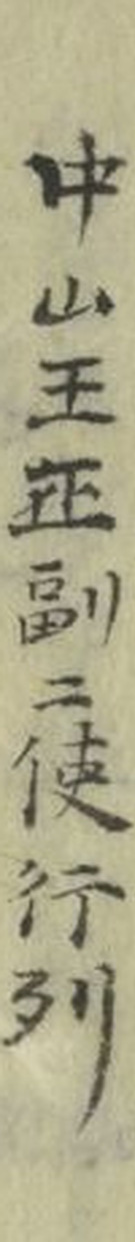中山王正副二使行列
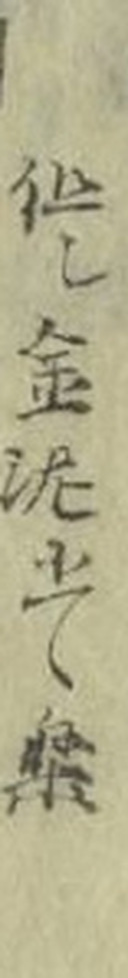但し金泥にて楽
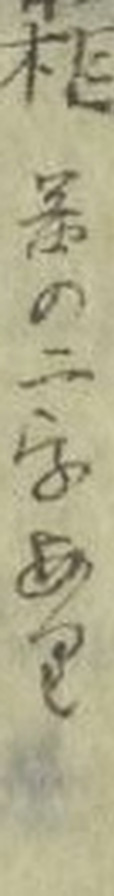器の二字あり
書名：天保三年来朝 琉球人行列記
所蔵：University of the Ryukyus Library
